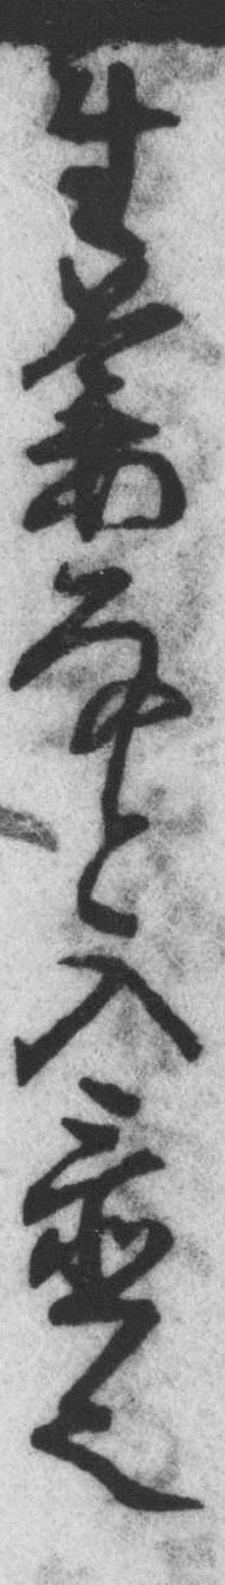生姜なと入置也
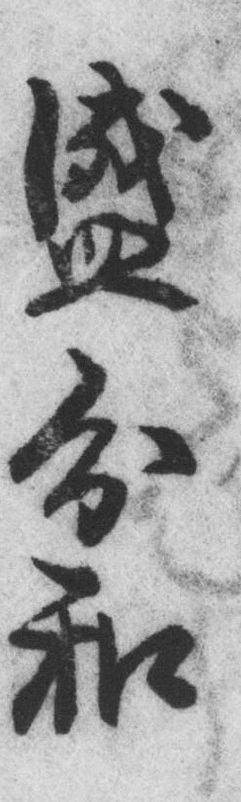盛分和
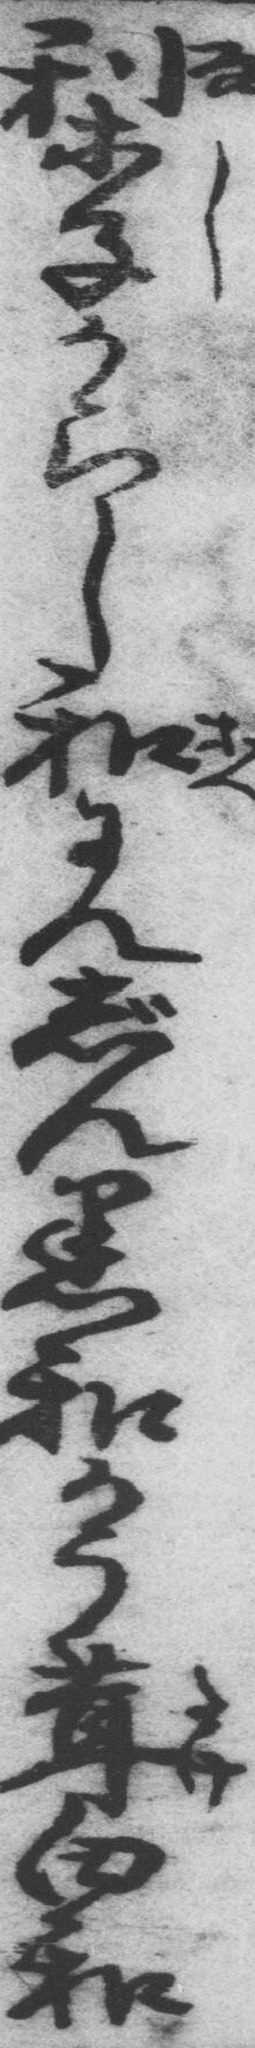梨子からし和にんじん黒和かう茸白和
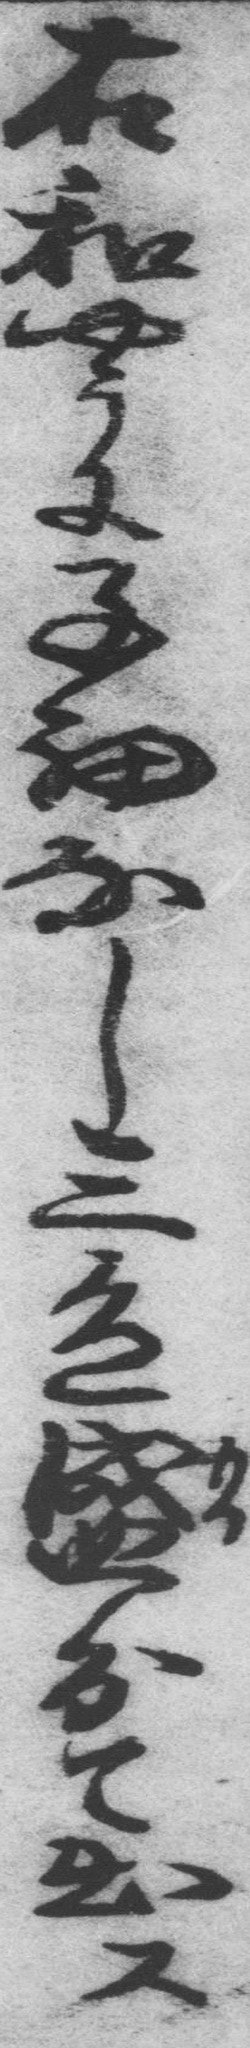右和やうに子細さし三色盛分て出す
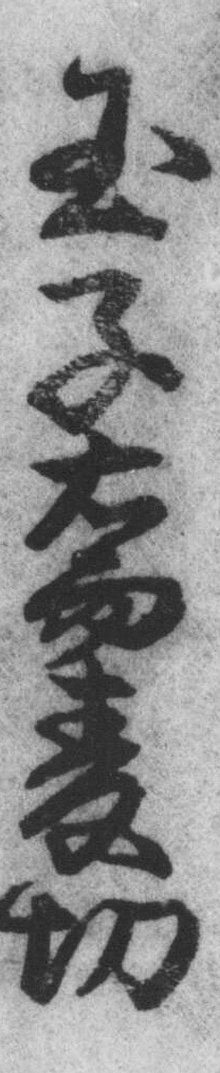玉子蕎麦切
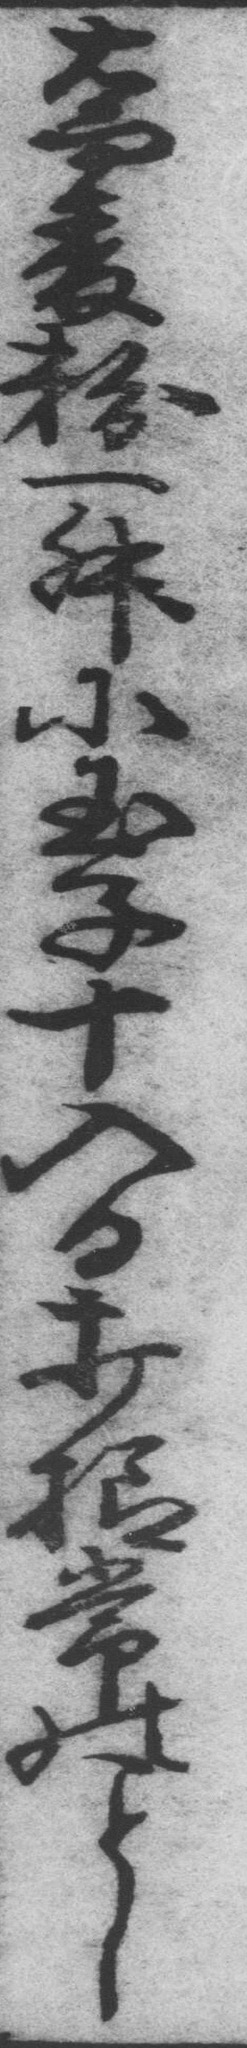蕎麦粉一升に玉子十入る打様常のことし

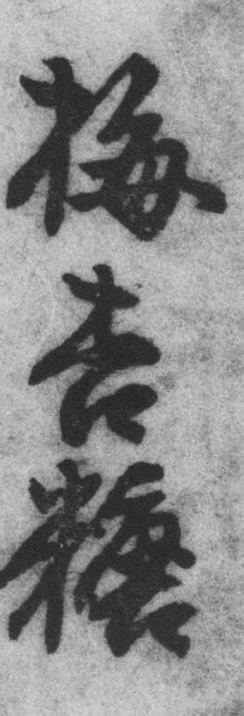梅杏糖
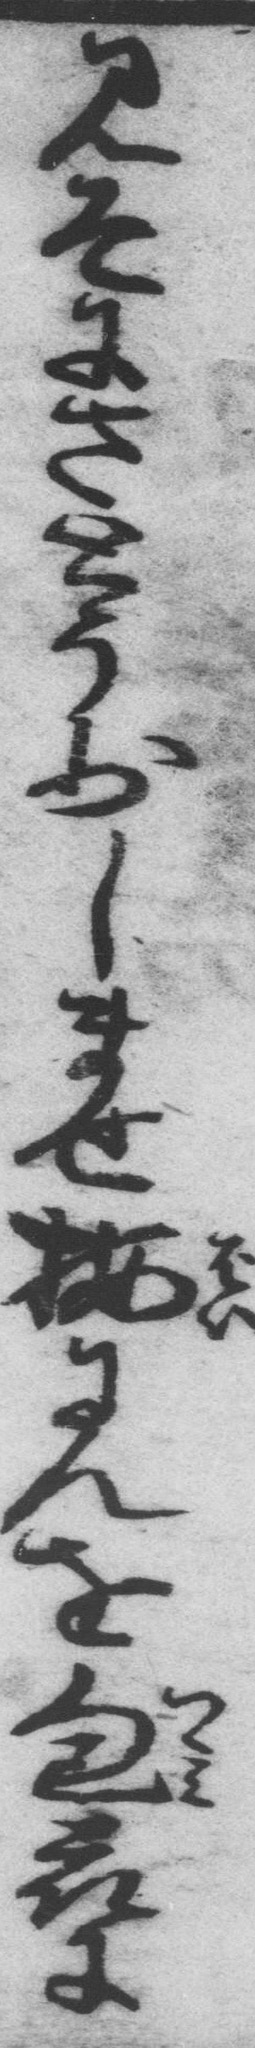みそにさとう少しませ梅にんを包表に
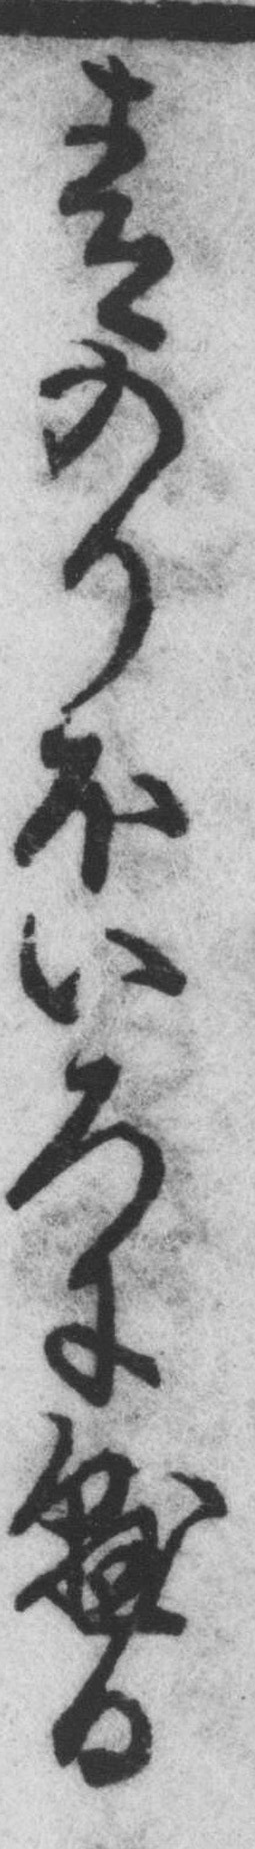青のりほいろに懸る
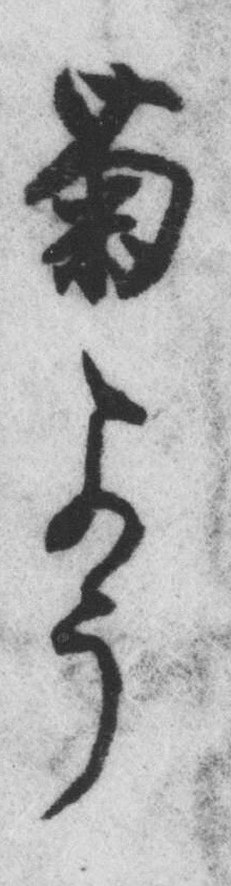菊よう
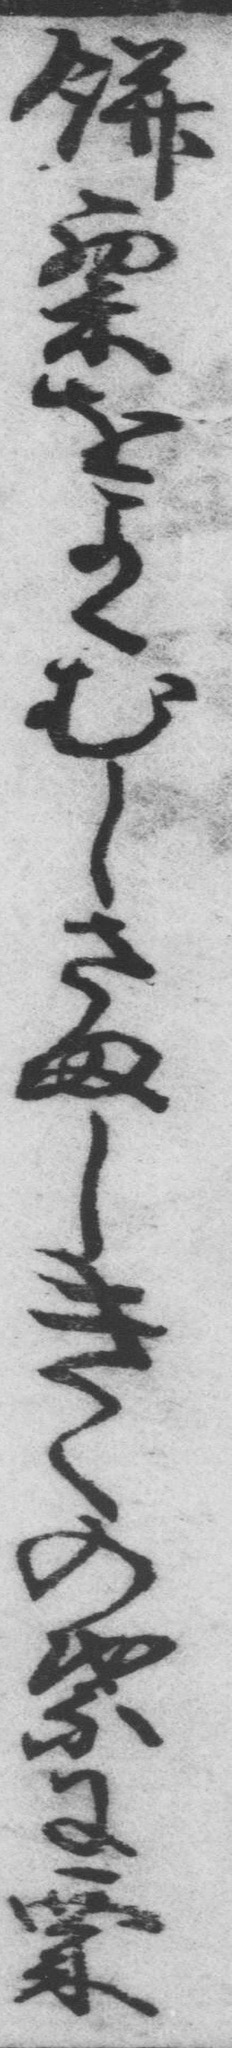餅粟をよくむしさましきくの葉に粟
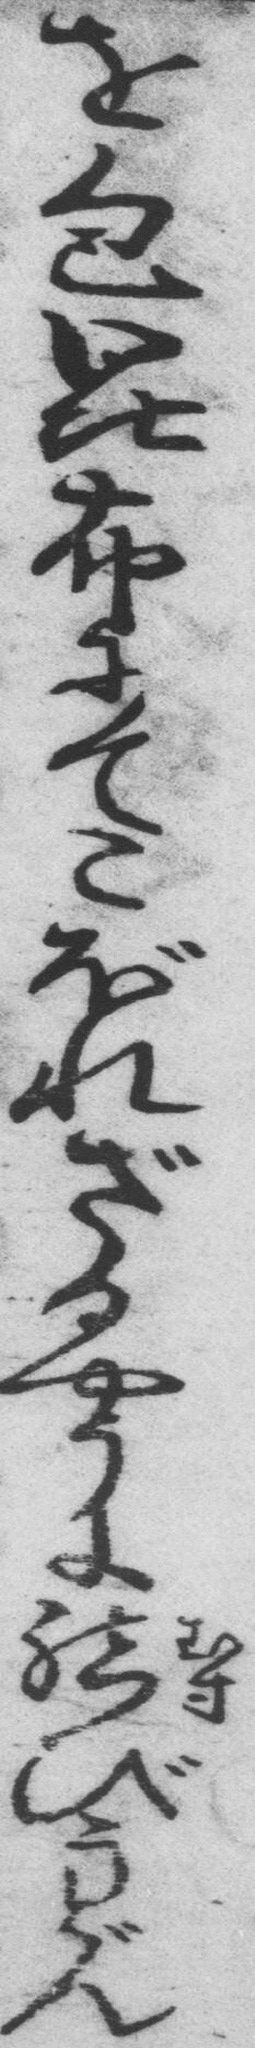を包昆布にてこぼれざるやうに結びうどん
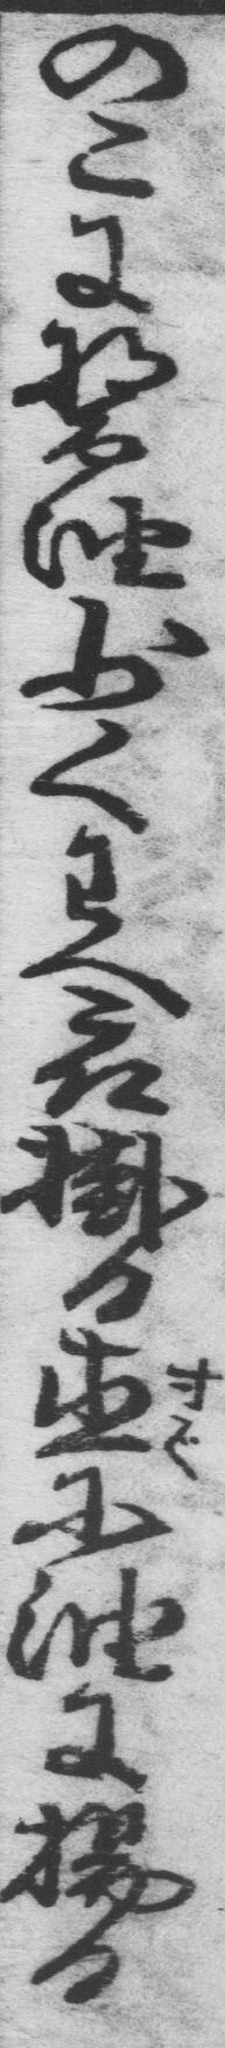のこに醤油少くわへ衣懸る直に油に揚る
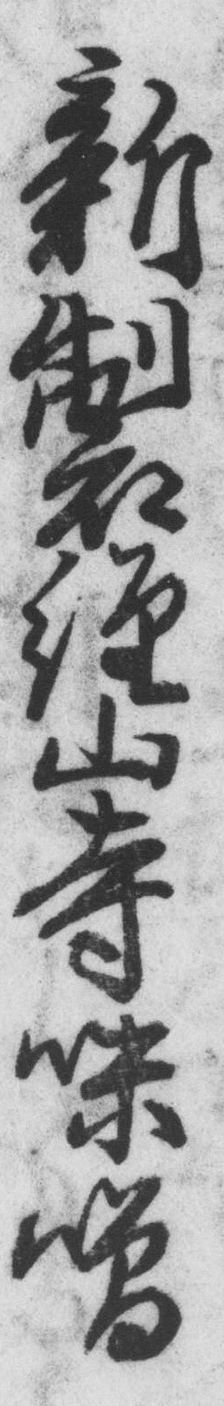新製経山寺味噌
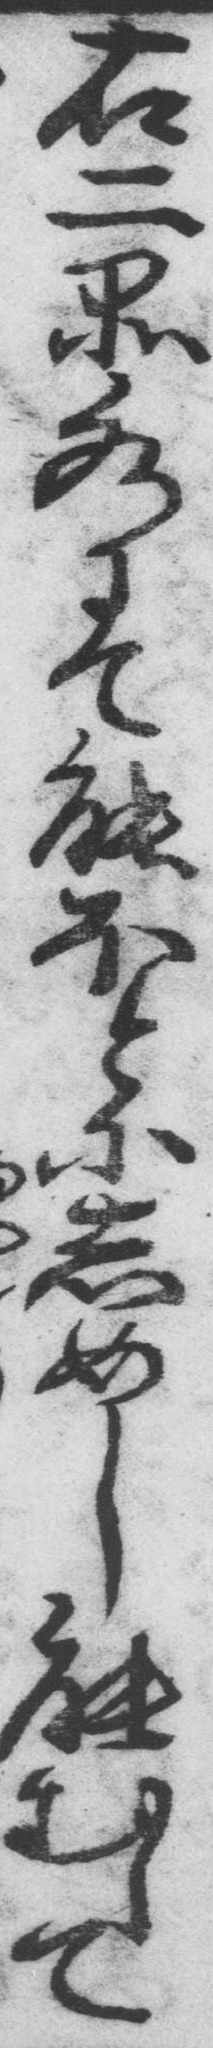右二品水にて能ほとにしめし能むして
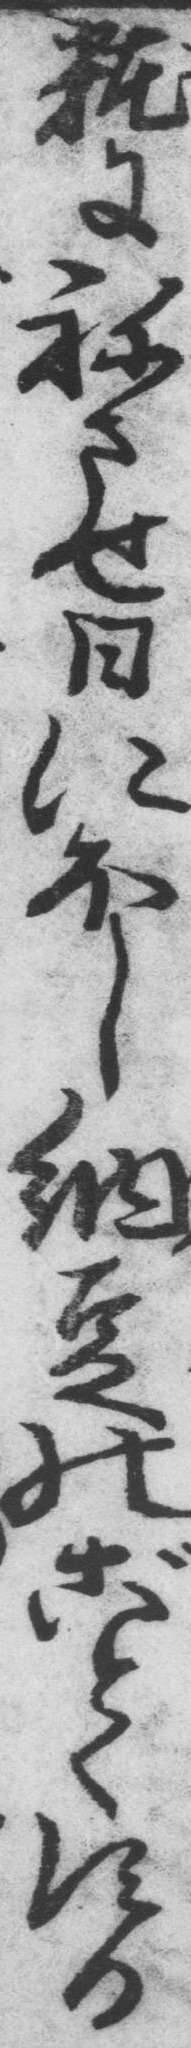糀にねさせ日にほし納豆のごとくする
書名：料理山海郷
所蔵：大阪府立大学学術情報センター 国文学研究資料館
